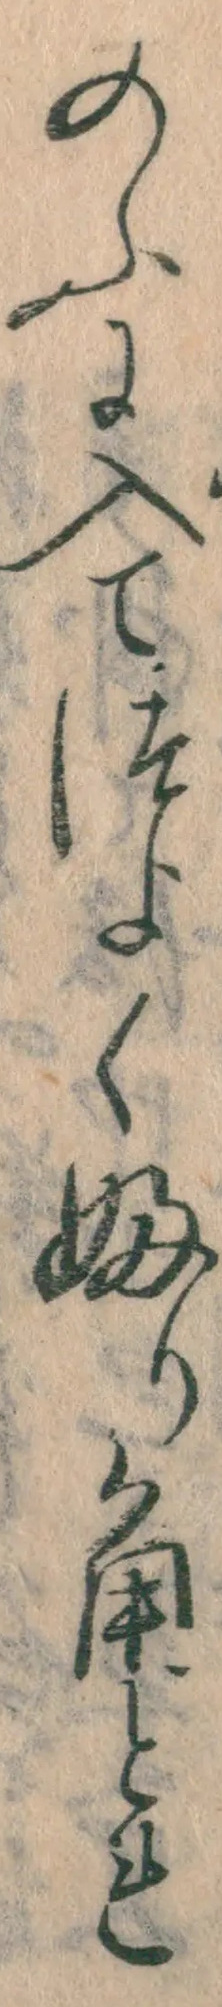のふに入てつよくふり角とれ
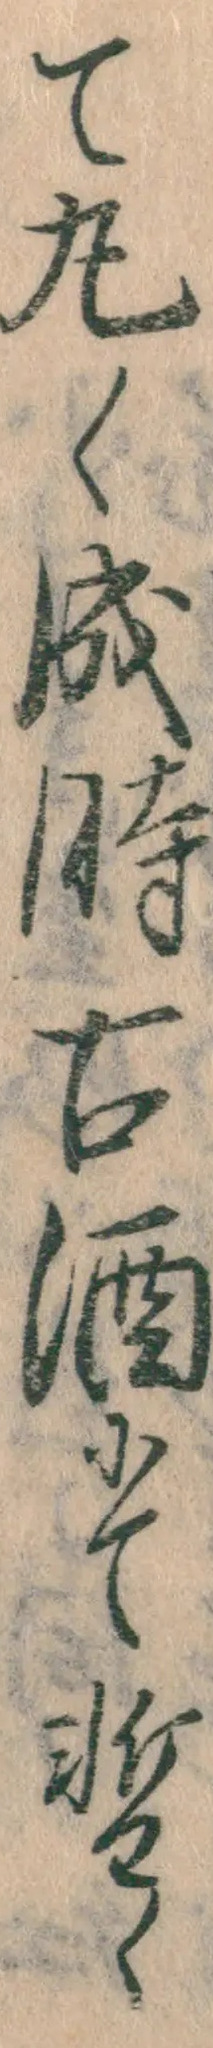て丸く成時古酒にて暫く
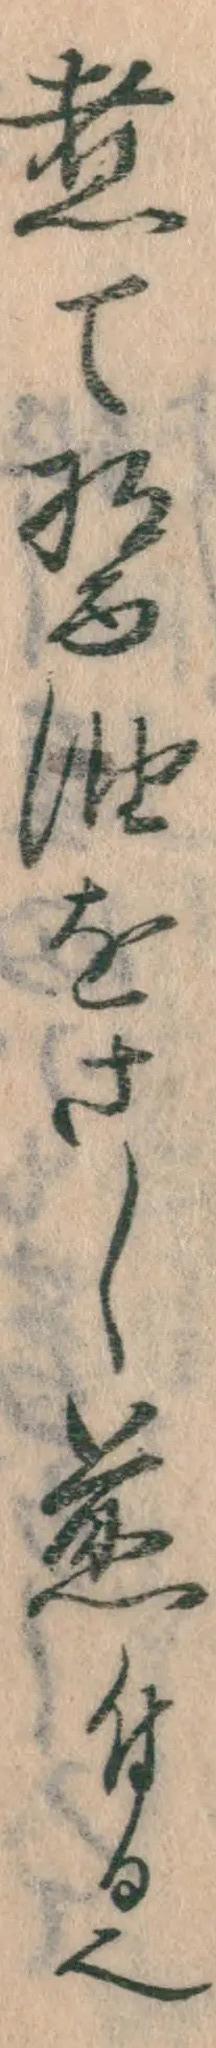煮て醤油をさし煎付る也
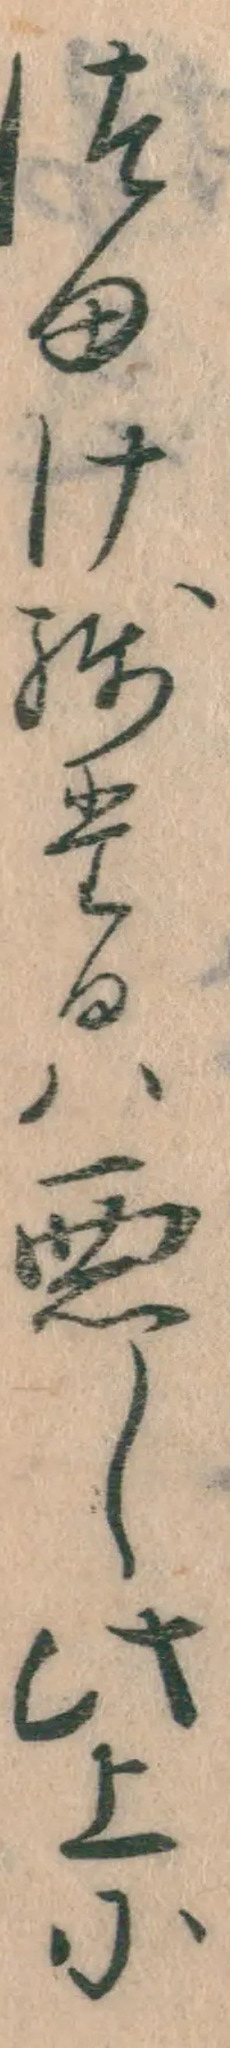つゆけ残たるは悪し此上に
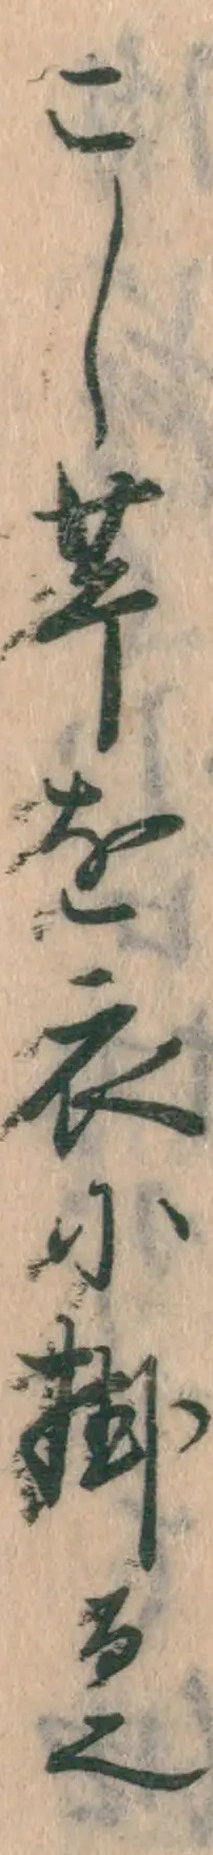こし芋を衣に掛る也
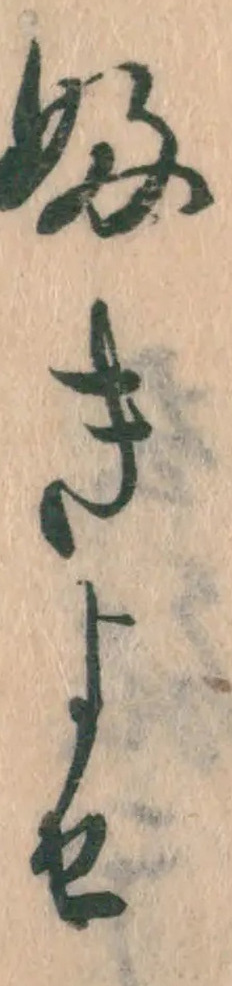ふきよせ
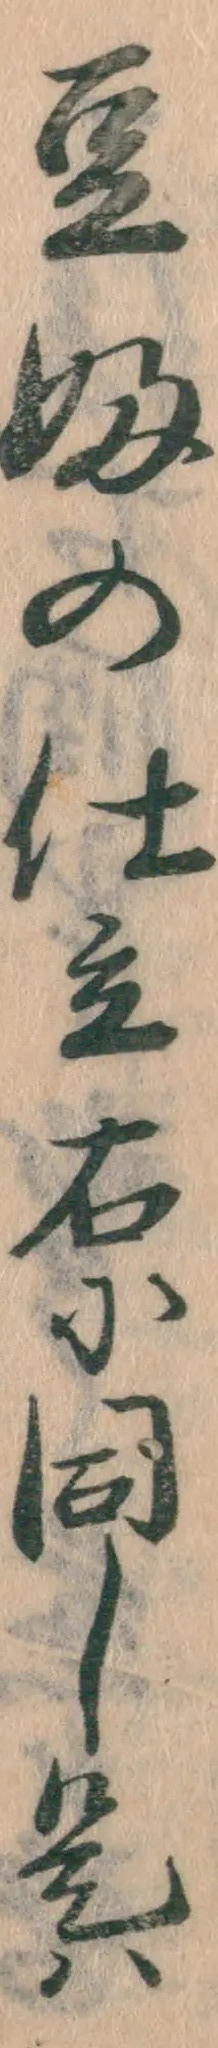豆ふの仕立右に同し是は
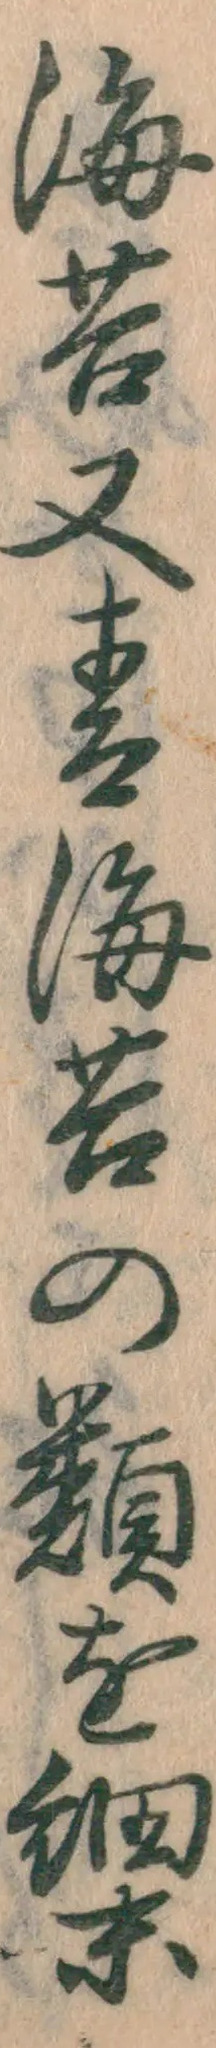海苔又青海苔の類を細末
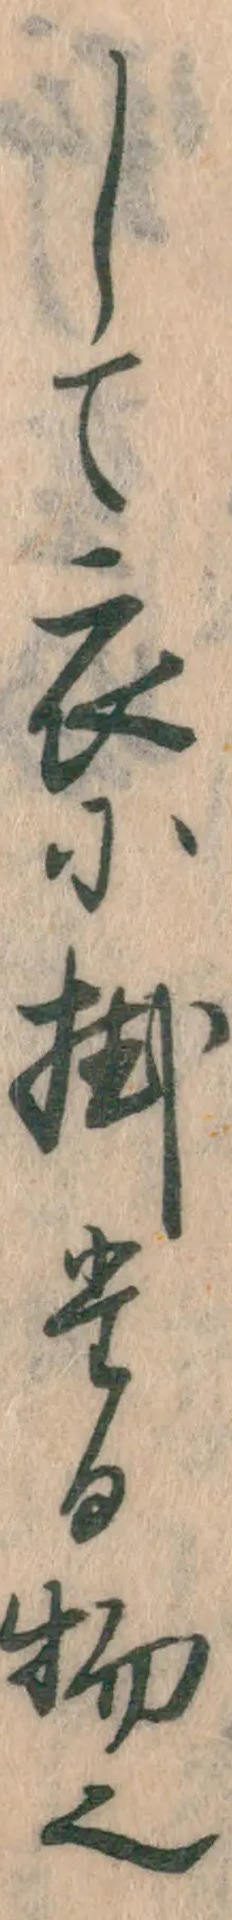して衣に掛たる物也
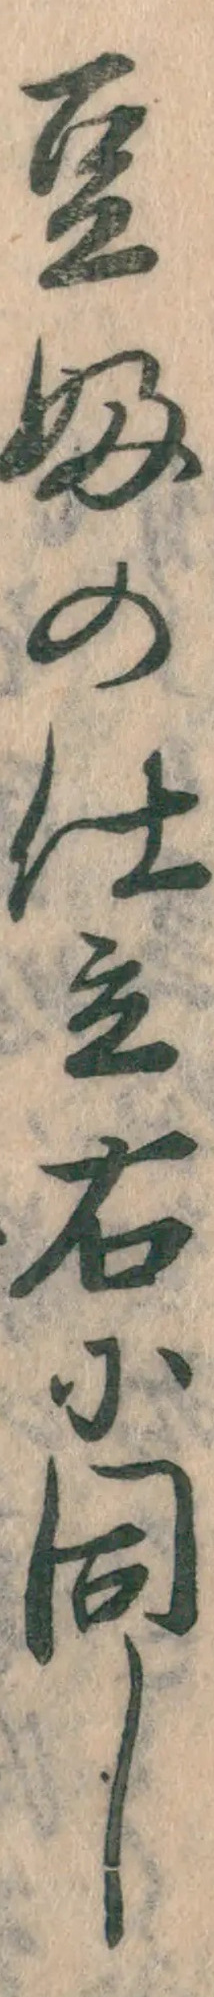豆ふの仕立右に同し
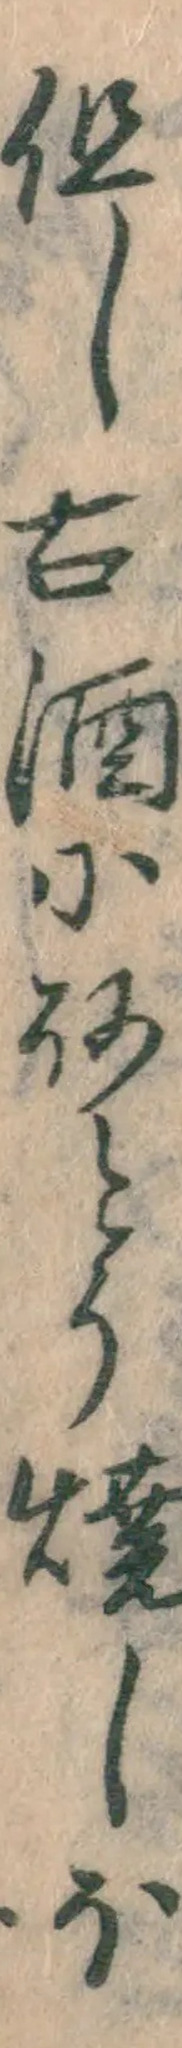但し古酒に砂とう焼しほ
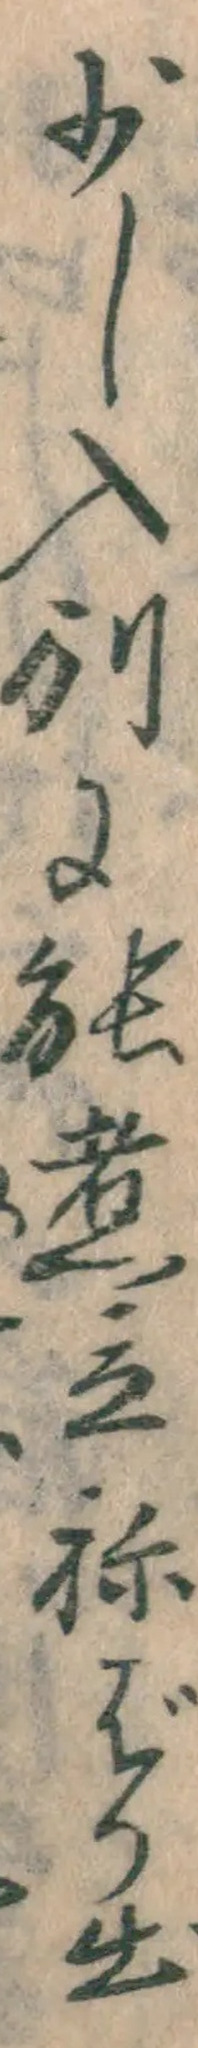少し入別に能煮立ねばり出
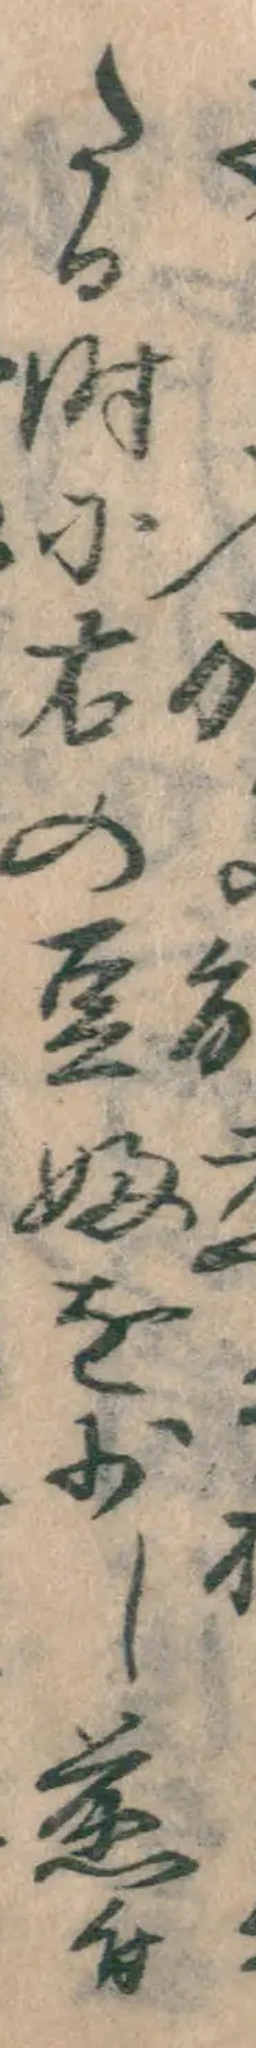たる時に右の豆ふを少し煎付
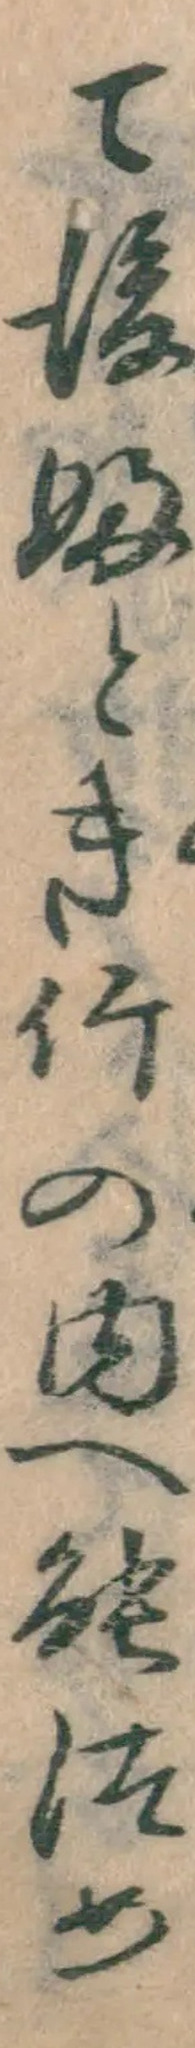て後ふとき竹の内へ能つめ

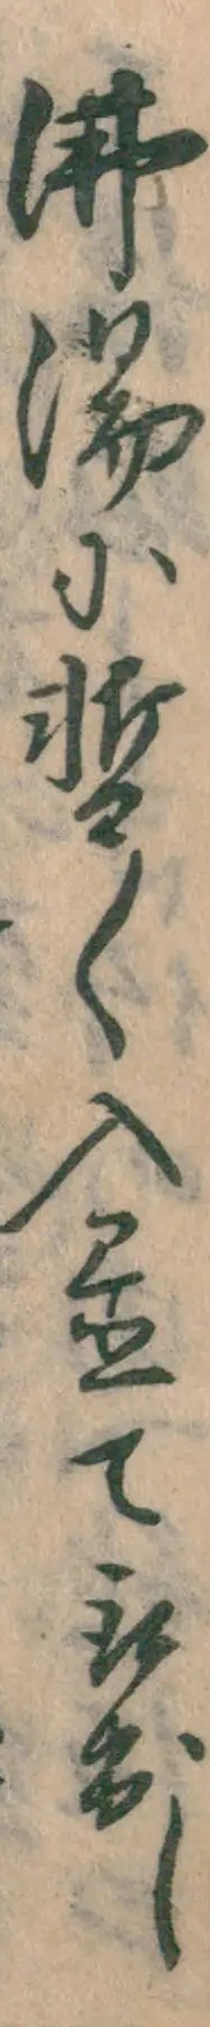沸湯に暫く入置て取出し
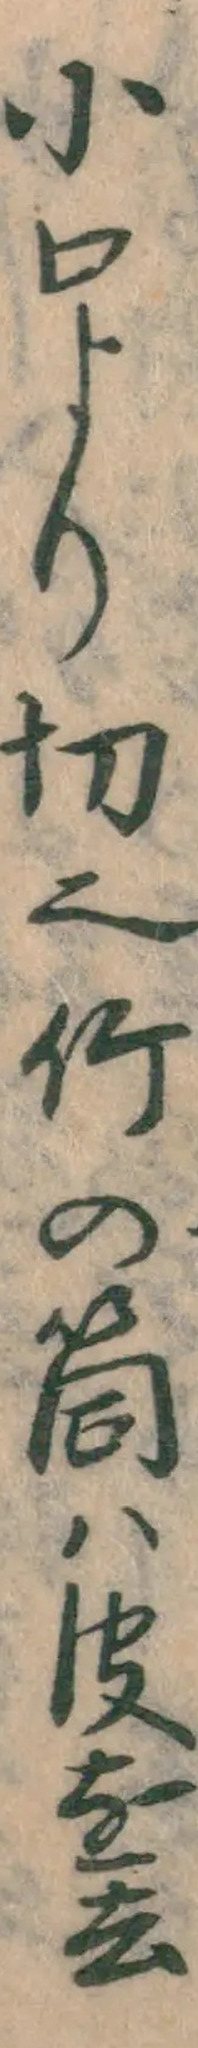小口より切也竹の筒は皮を去
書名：豆腐百珍余録
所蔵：国立国会図書館 National Diet Library, JAPAN
